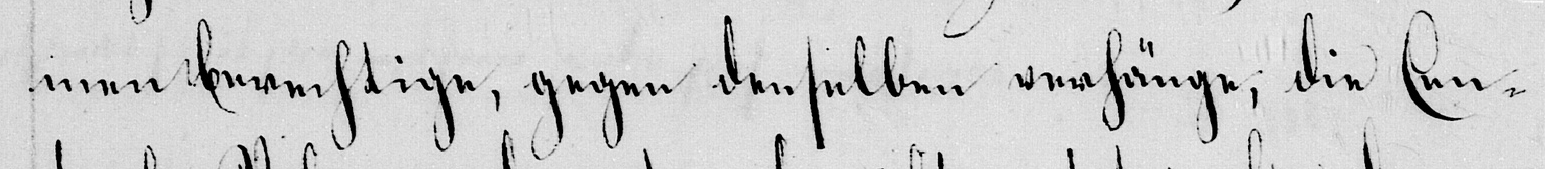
men berechtige, gegen denselben verhänge, die Cen¬
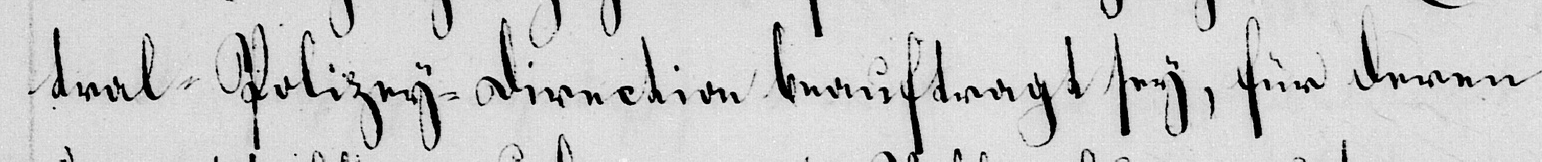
tral-Polizey-Direction beauftragt sey, für deren
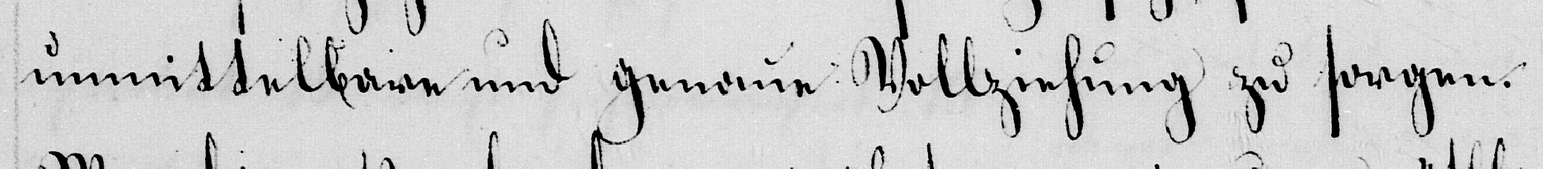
unmittelbare und genaue Vollziehung zu sorgen.
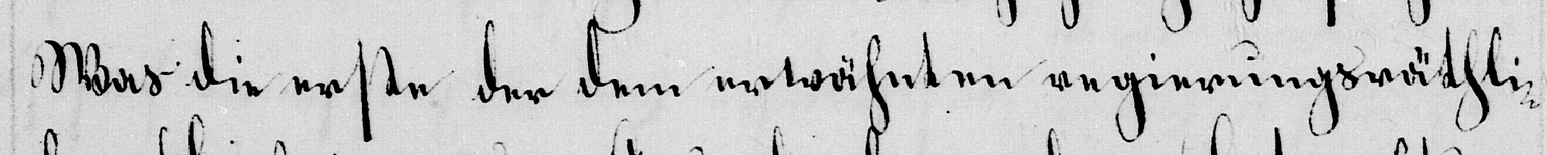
Was die erste der dem erwähnten regierungsräthli¬
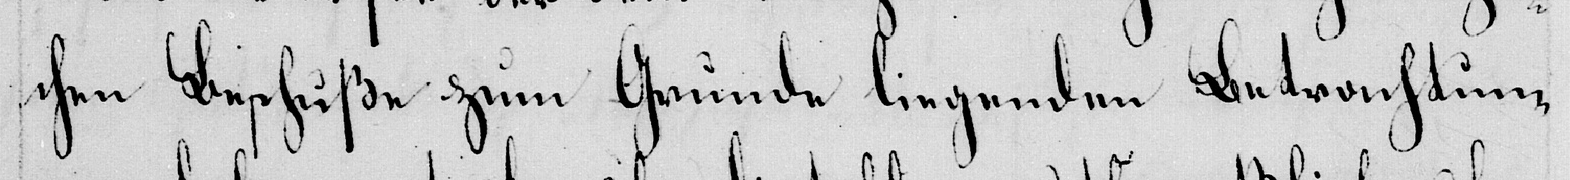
chen Beschluße zum Grunde liegenden Betrachtun¬
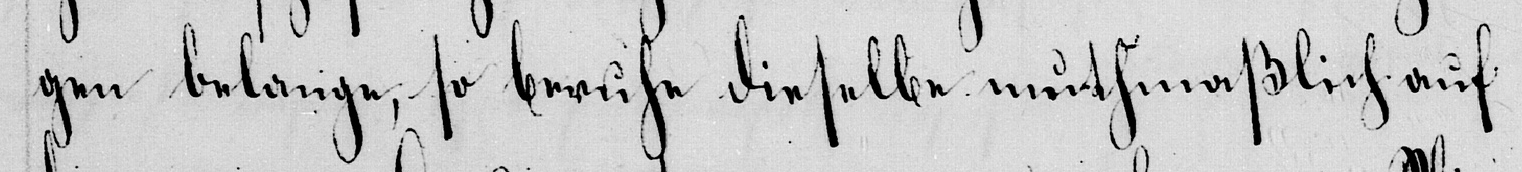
gen belange, so beruhe dieselbe muthmaßlich auf
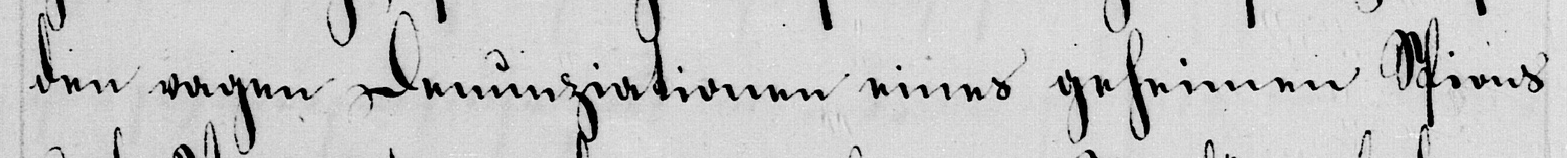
den vagen Denunziationen eines geheimen Spions
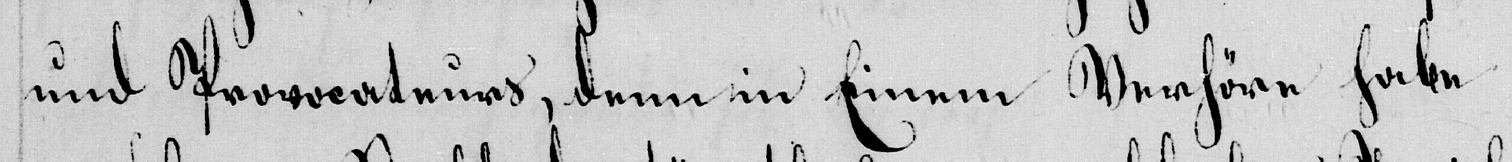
und Provocateurs, denn in Einem Verhöre habe
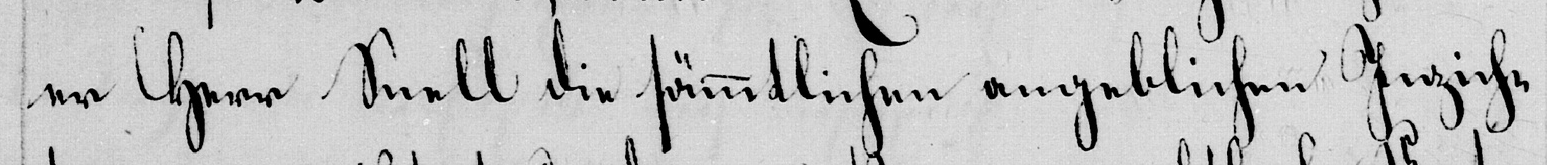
er Herr Snell die sämmtlichen angeblichen Inzich¬
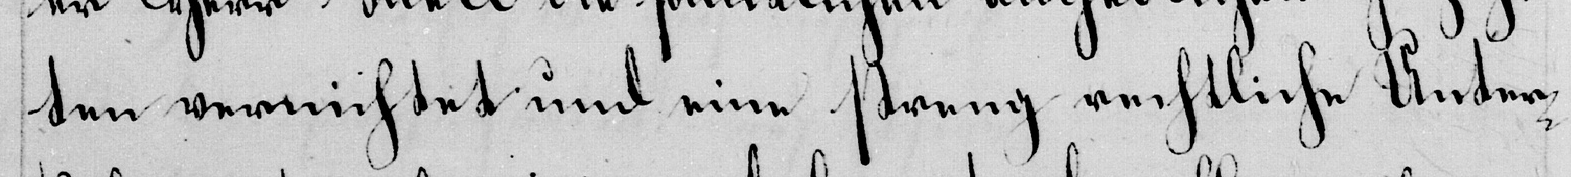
ten vernichtet und eine streng amtliche Unter¬
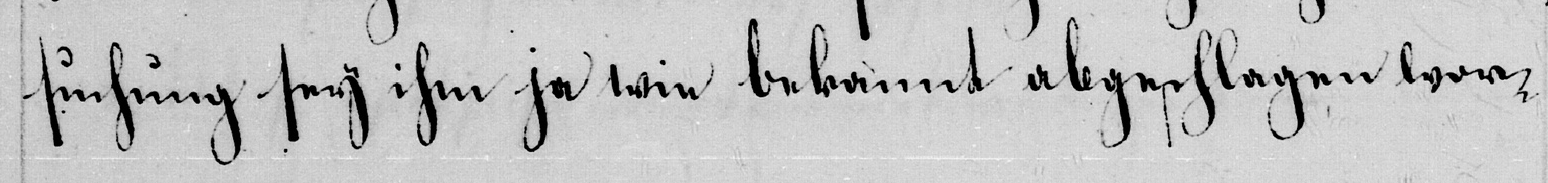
suchung sey gegen ihm ja wie bekannt abgeschlagen wor-
